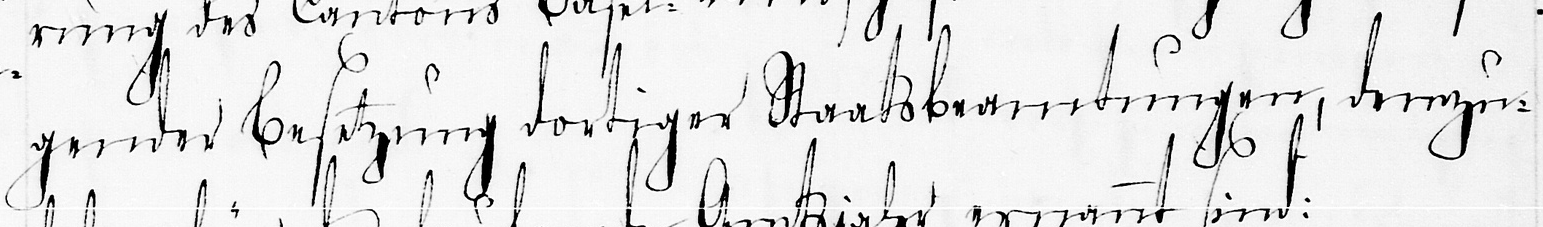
gender Besetzung dortiger Staatsbeamtungen, demzu¬
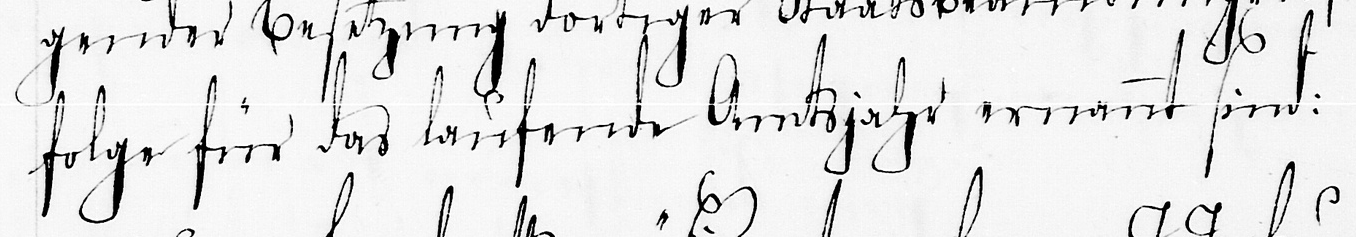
folge für das laufende Amtsjahr ernannt sind:
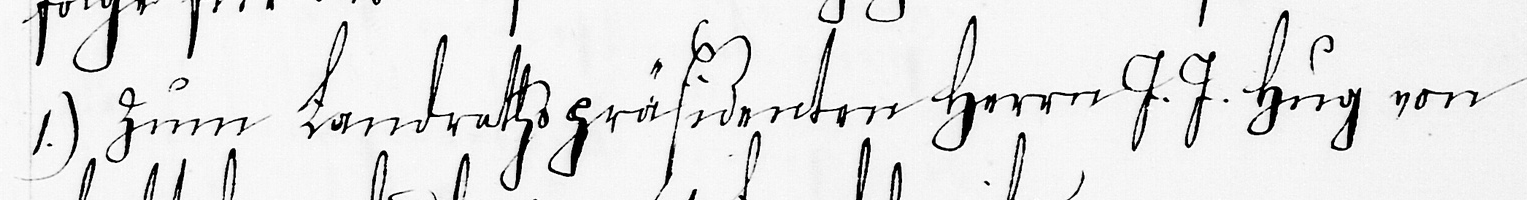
1.) Zum Landrathspräsidenten Herrn J. J. Hug von
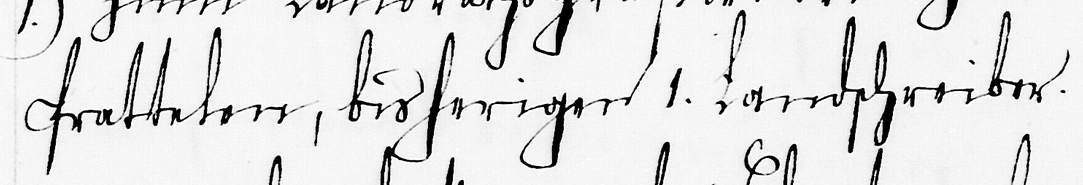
Prattelen, bisherigen 1. Landschreiber.
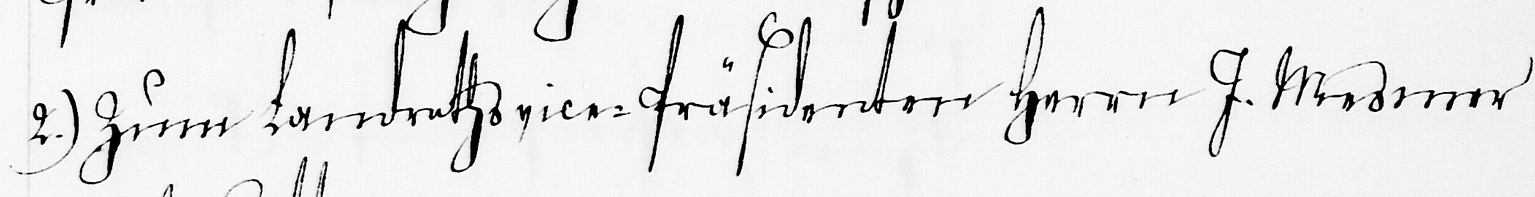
2.) Zum Landrathsvice-Präsidenten Herrn J. Mesmer
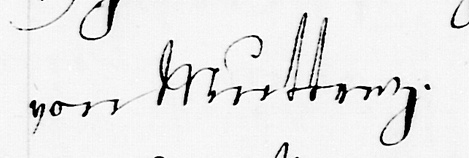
von Muttenz.
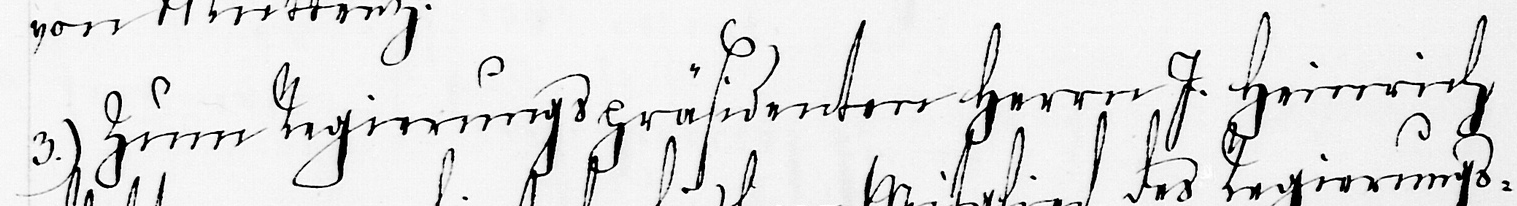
3. Zum Regierungspräsidenten Herrn J. Heinrich
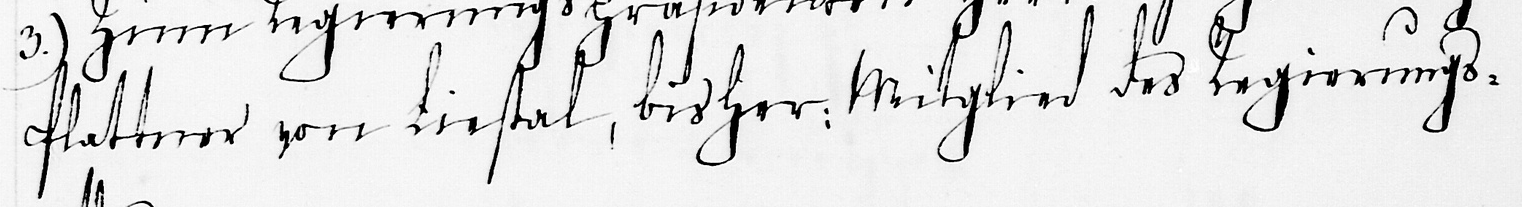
Plattner von Liestal, bisher: Mitglied des Regierungs¬
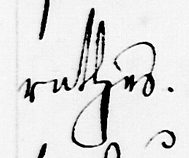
rathes.
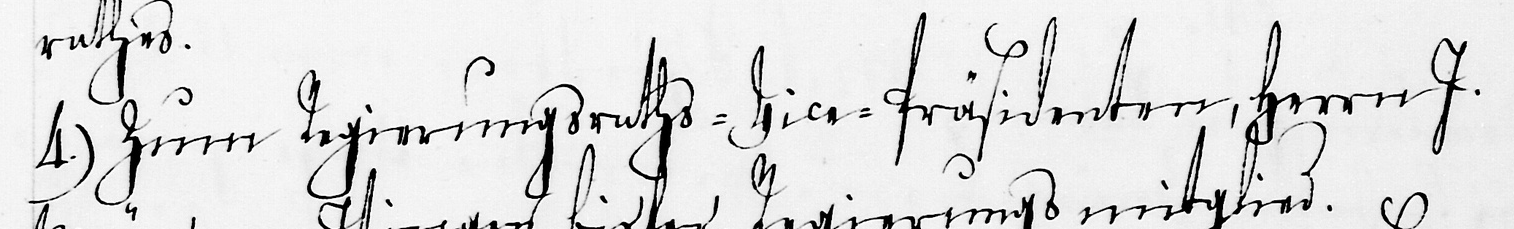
4.) Zum Regierungsraths-Vice-Präsidenten, Herrn J.
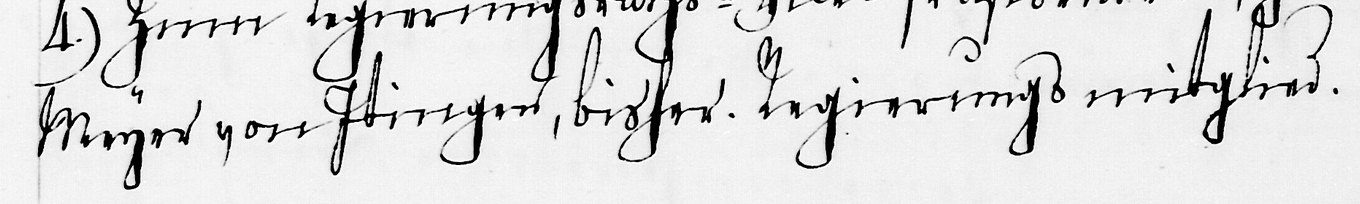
Meyer von Itingen, bisher. Regierungsmitglied.
